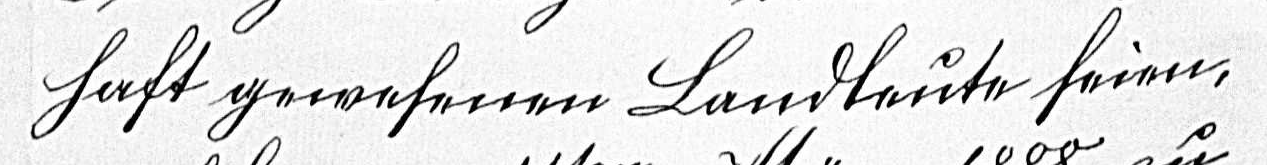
haft gewesenen Landleute seien,
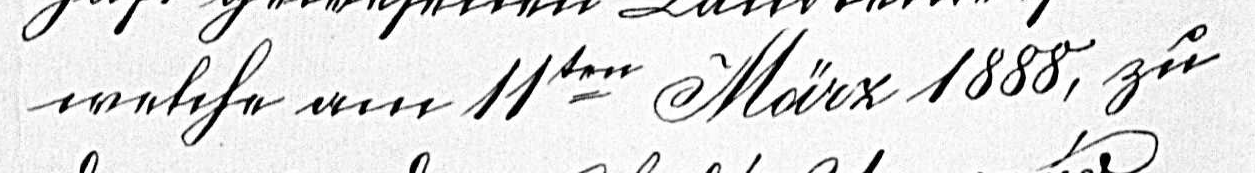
welche am 11ten März 1888, zu
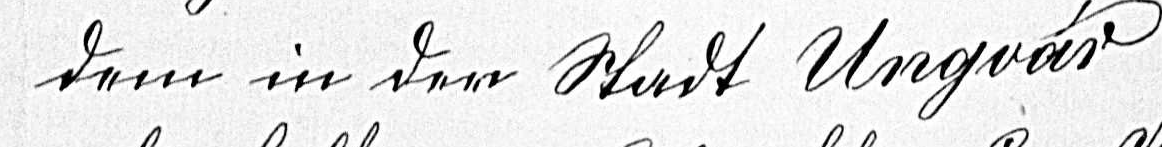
dem in der Stadt Ungvár
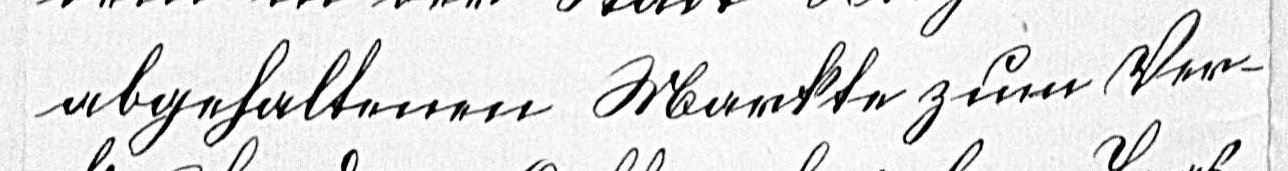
abgehaltenen Markte zum Ver¬
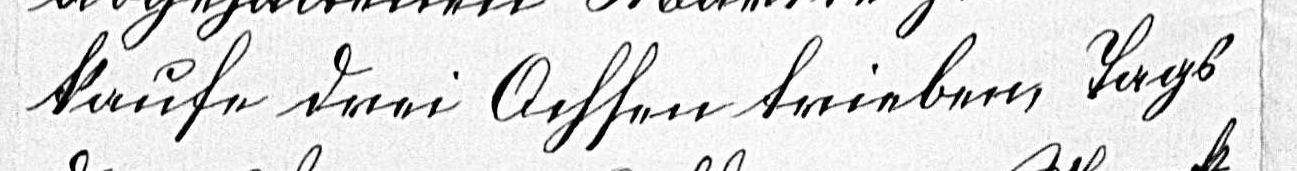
kaufe drei Ochsen trieben, Tags
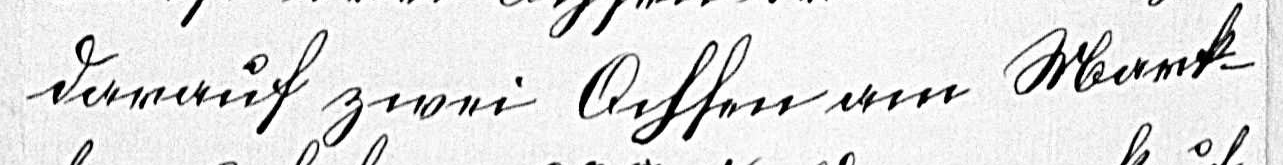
darauf zwei Ochsen am Wark¬
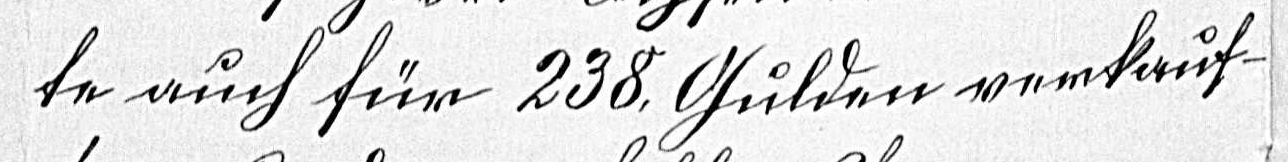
te auch für 238, Gulden verkauf¬
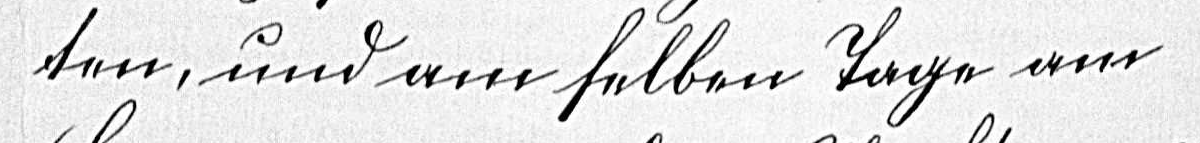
ten, und am selben Tage am
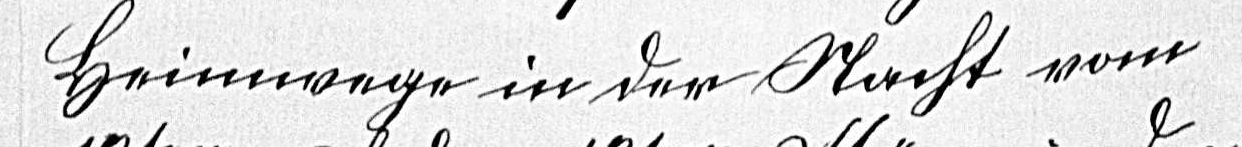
Heimwege in der Nacht vom
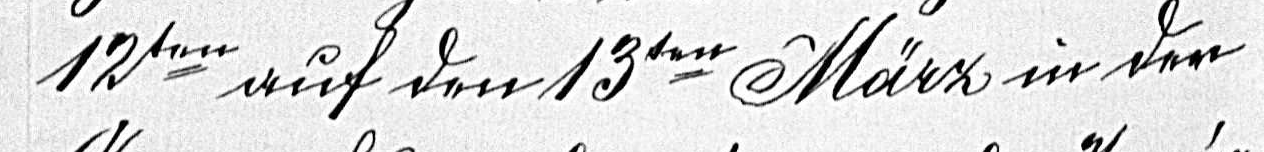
12ten auf den 13ten März in der
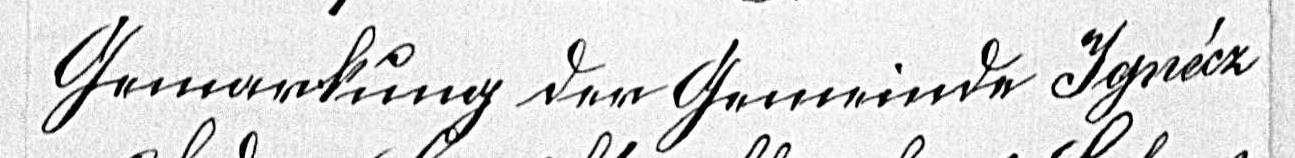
Gemarkung der Gemeinde Jgnécz
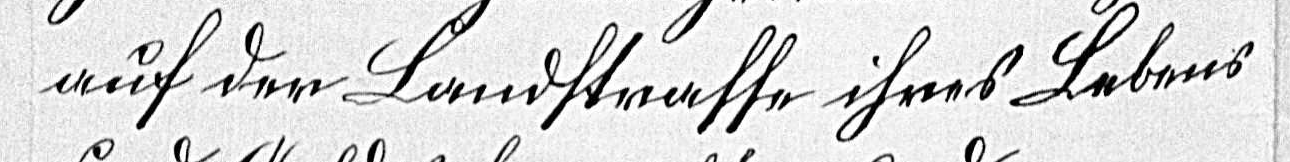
auf der Landstraffe ihres Lebens
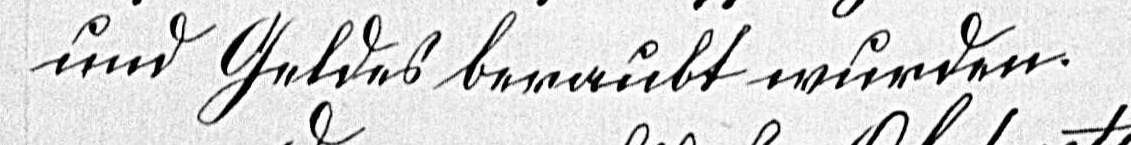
und Geldes beraubt wurden.
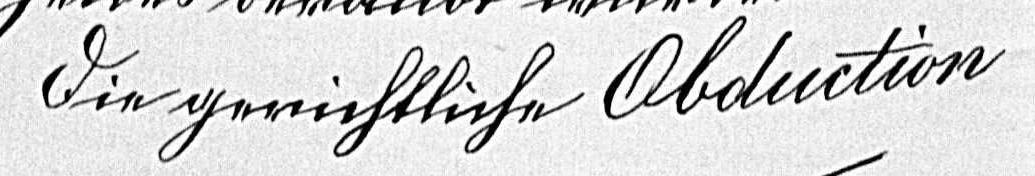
Die gerichtliche Obduction
